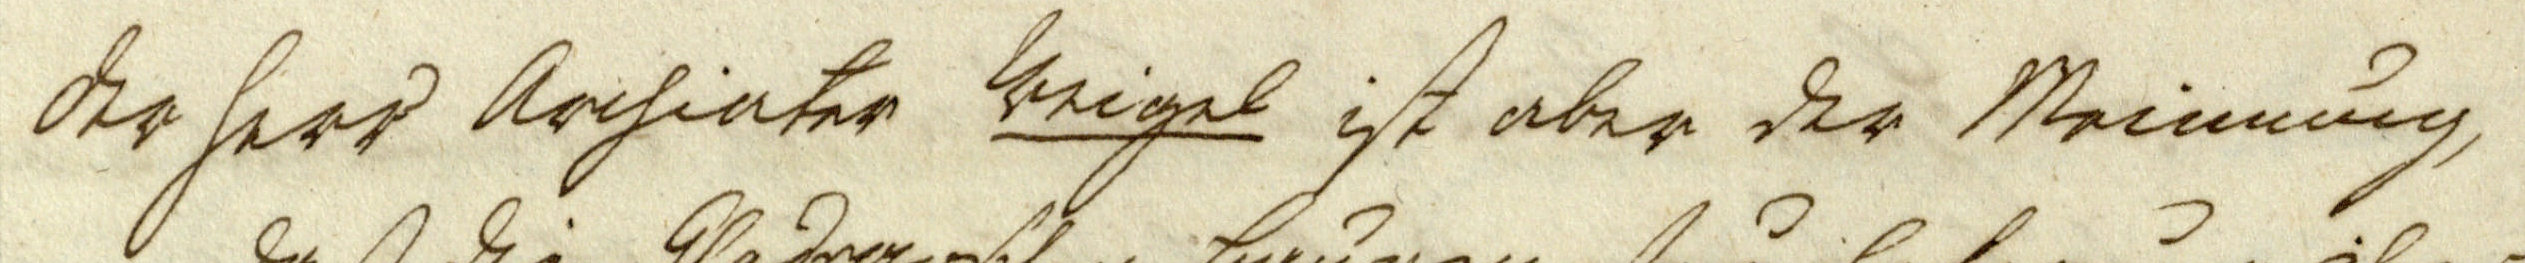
Der herr Archiater Weigel ist aber der Meinung,
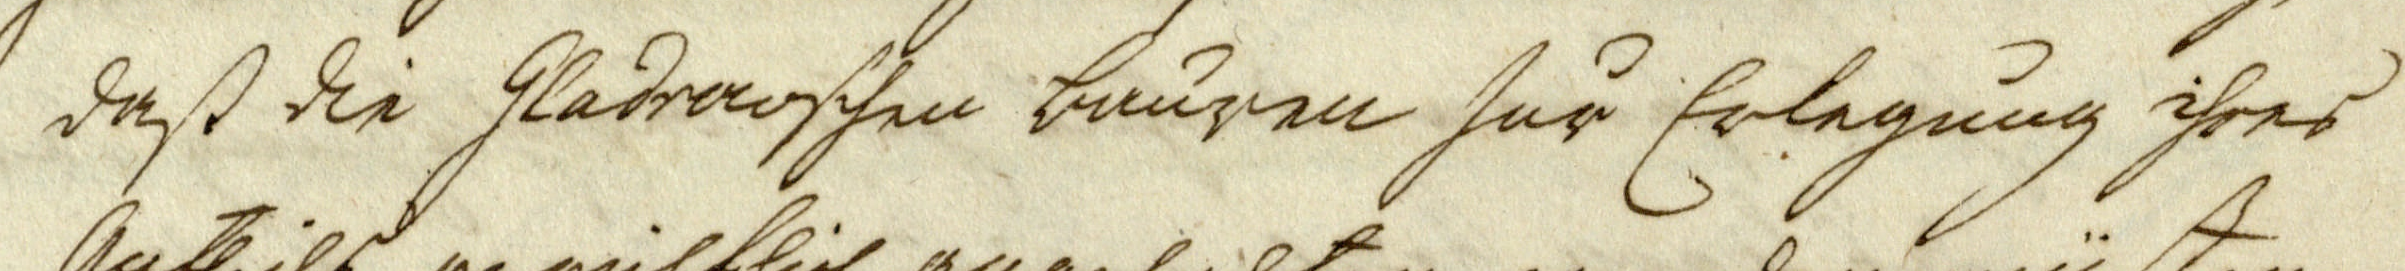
daß die Gladrowschen Bauren zur Erlegung ihres
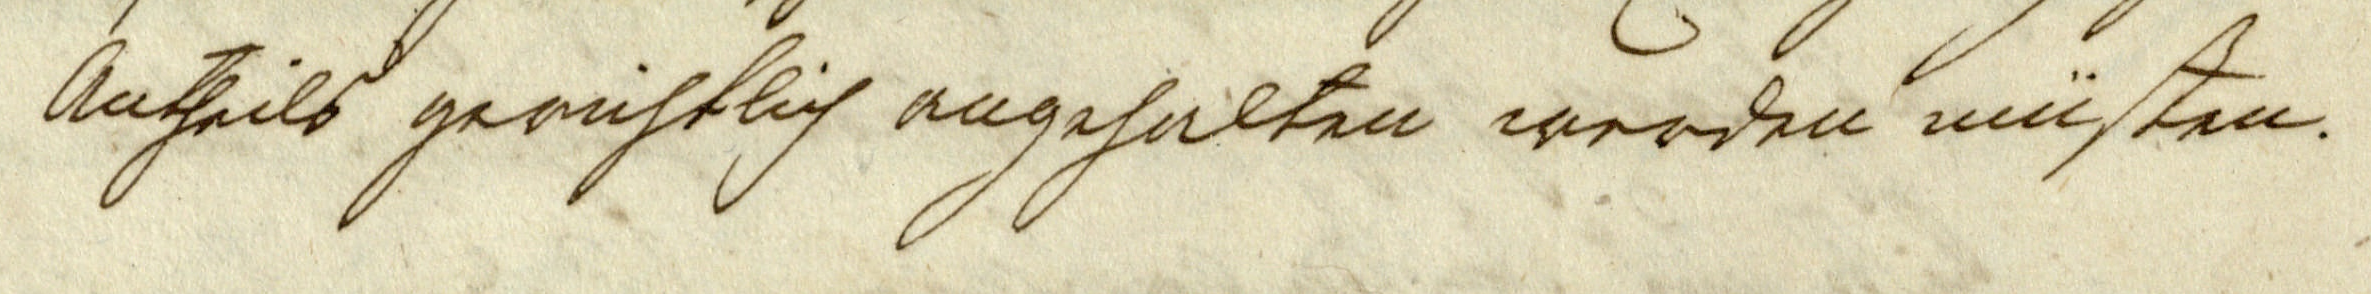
Antheils gerichtlich angehalten werden müsten.
